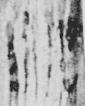臤（賢）
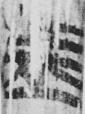者
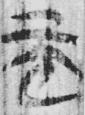而
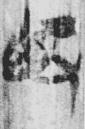臤（賢）
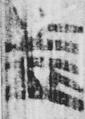者
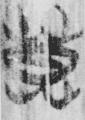莫
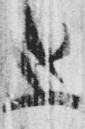之
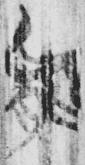能
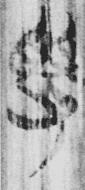受
